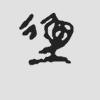{辶尾}
